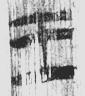王
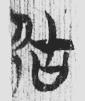居
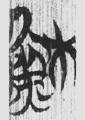{魚木}蘇
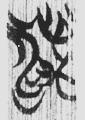澫
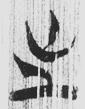之
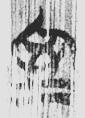室
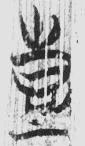彭
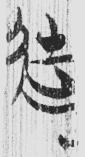徒
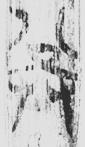{网𡴂}（返）
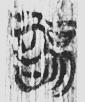諹
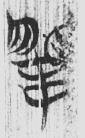{門串}（關）
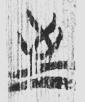至（致）
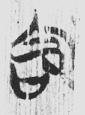命
